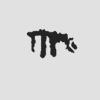神
